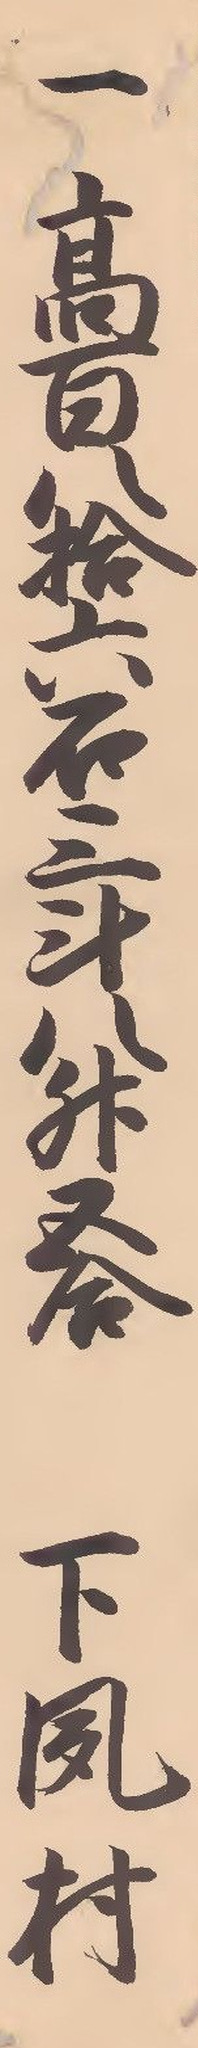一高百八拾六石三斗八升五合下夙村

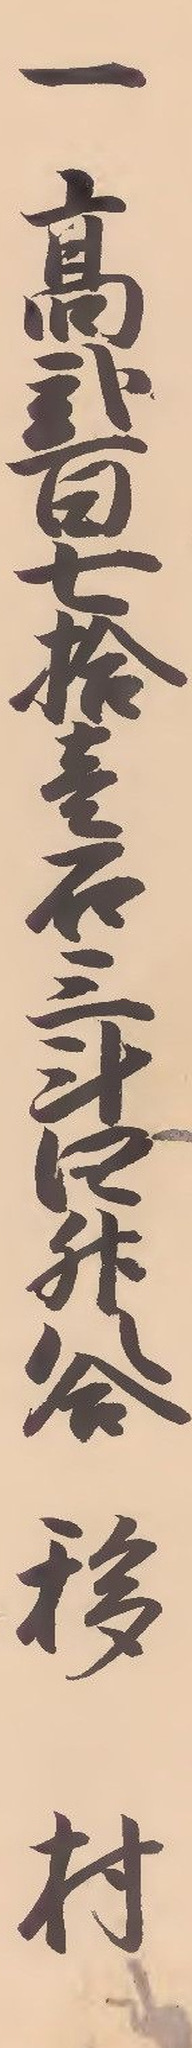一高弐百七拾壱石三斗四升八合移村
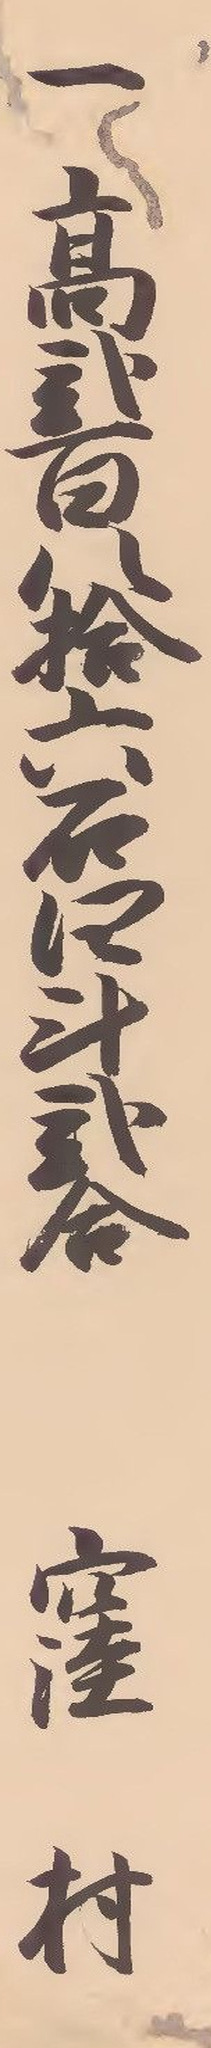一高弐百八拾六石四斗弐合窪村
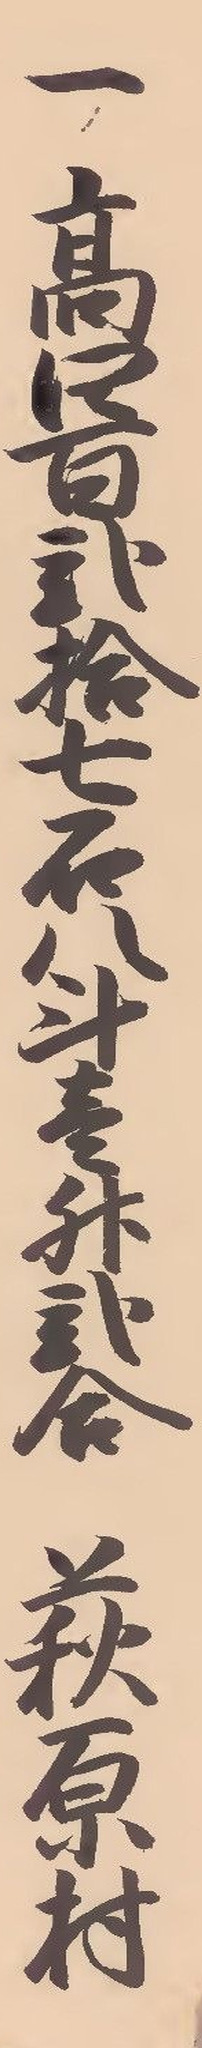一高四百弐拾七石八斗壱升弐合萩原村
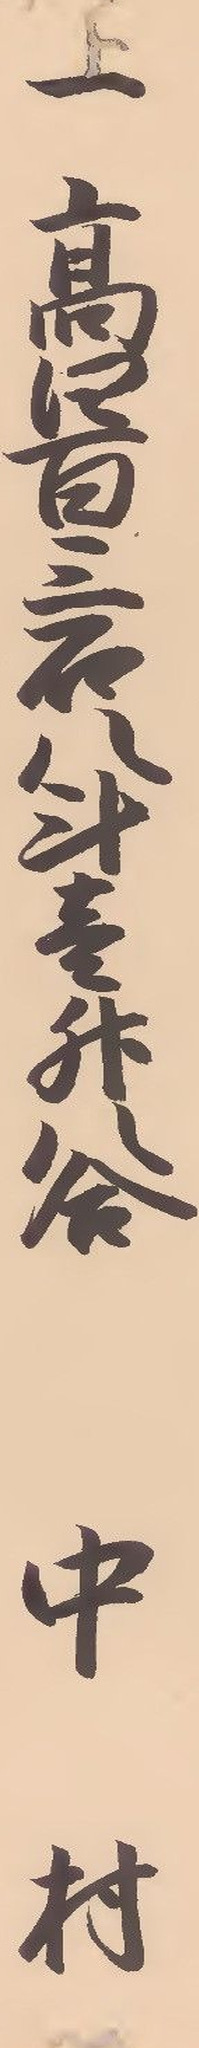一高四百三石八斗壱升八合中村
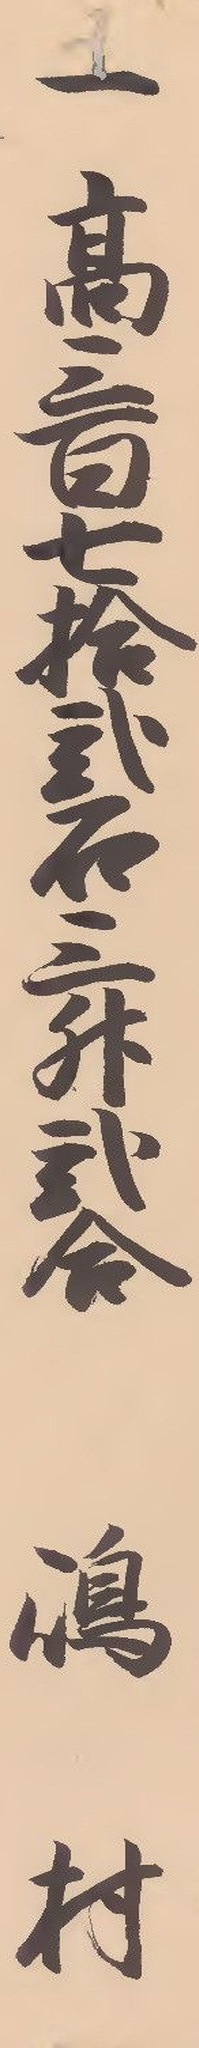一高三百七拾弐石三升弐合島村
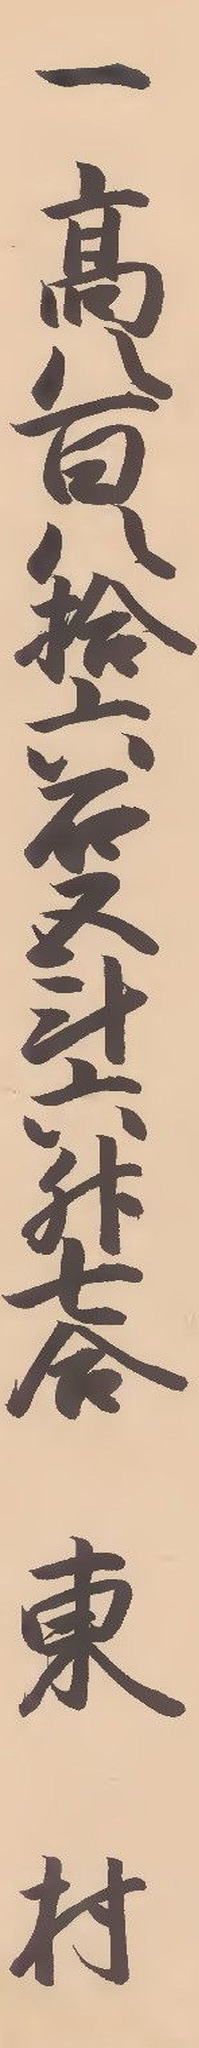一高八百八拾六石五斗六升七合東村
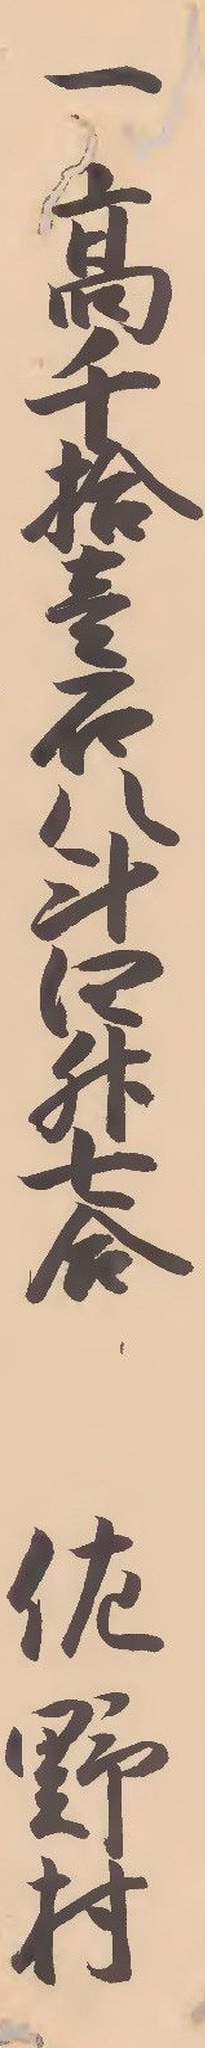一高千拾壱石八斗四升七合佐野村

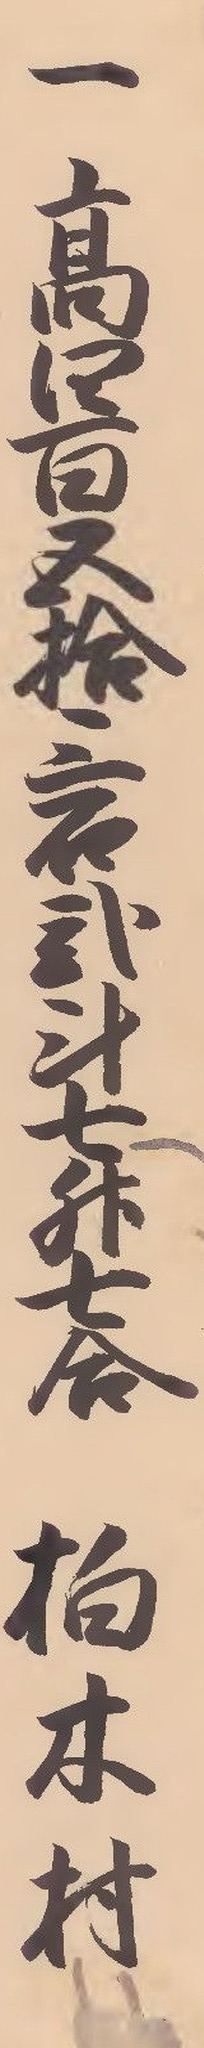一高四百五拾三石弐斗七升七合柏木村
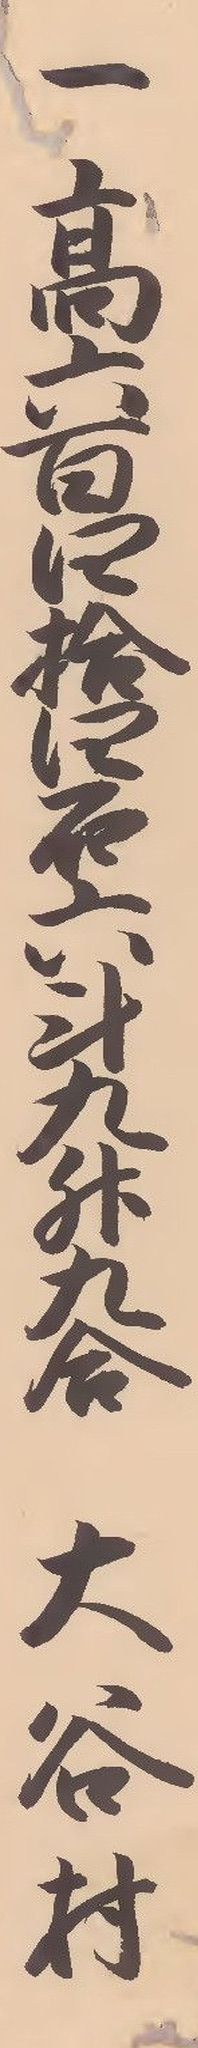一高六百四拾四石六斗九升九合大谷村
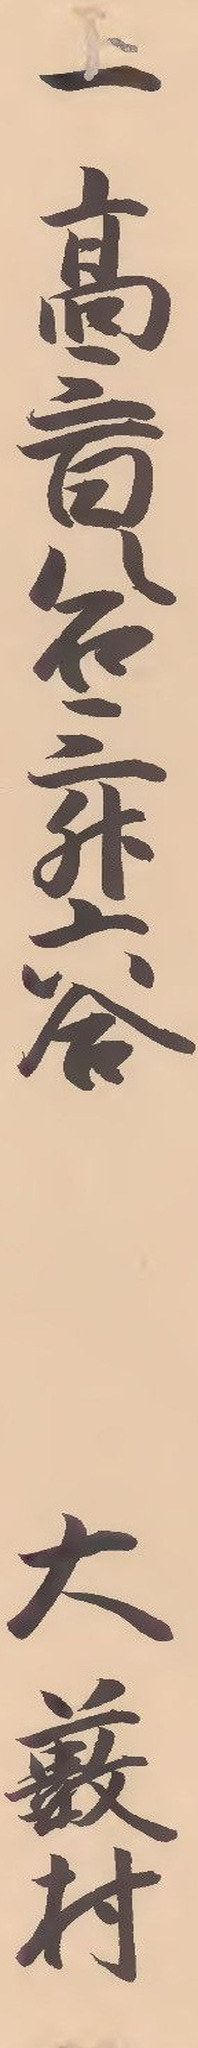一高三百八石三升六合大薮村
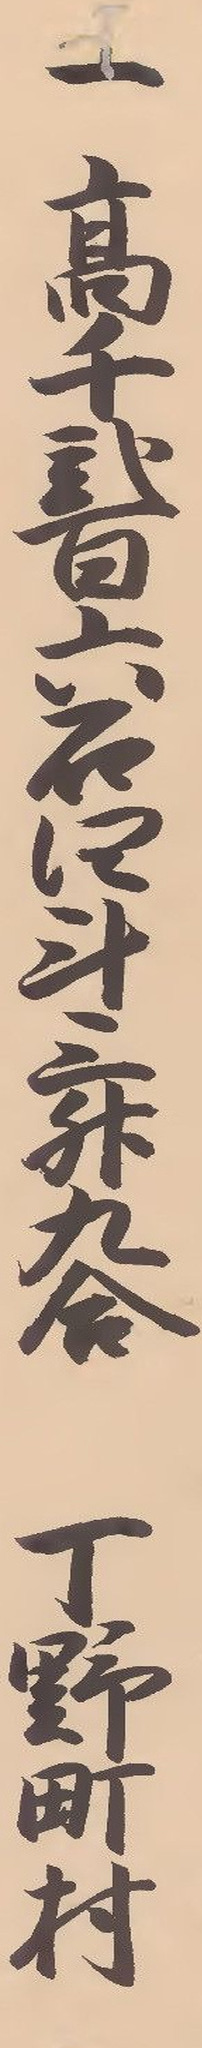一高千弐百六石四斗三升九合丁野町村
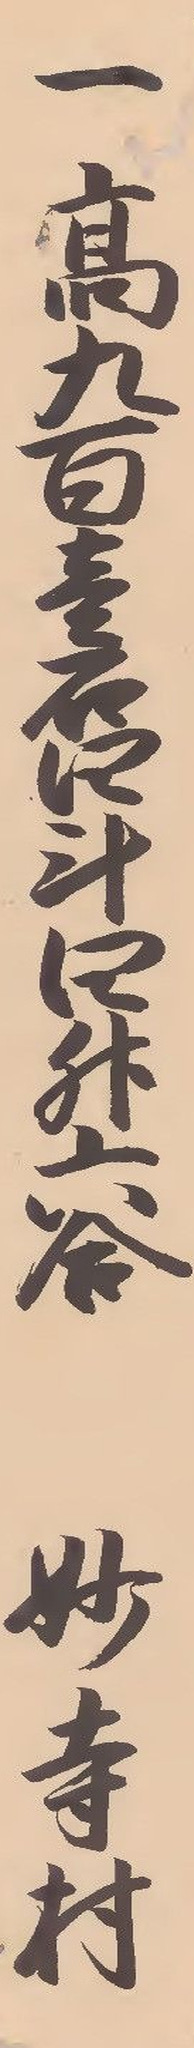一高九百壱石四斗四升六合妙寺村
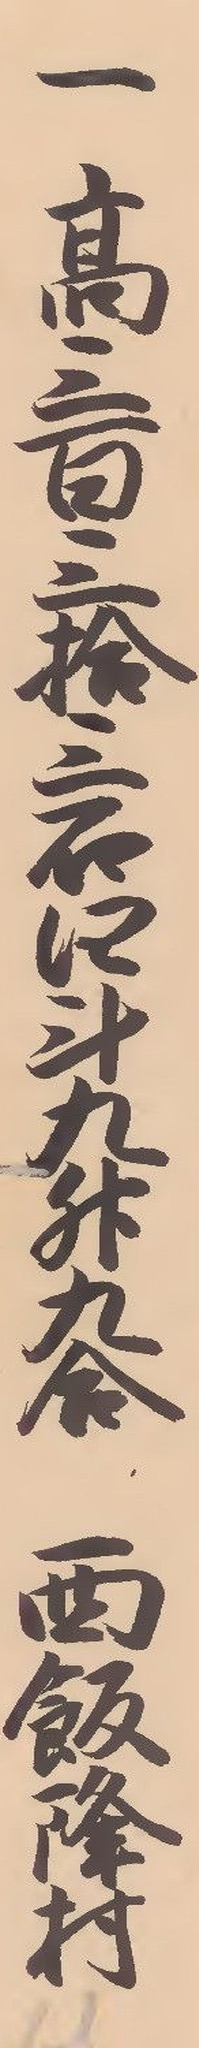一高三百三拾三石四斗九升九合西飯降村

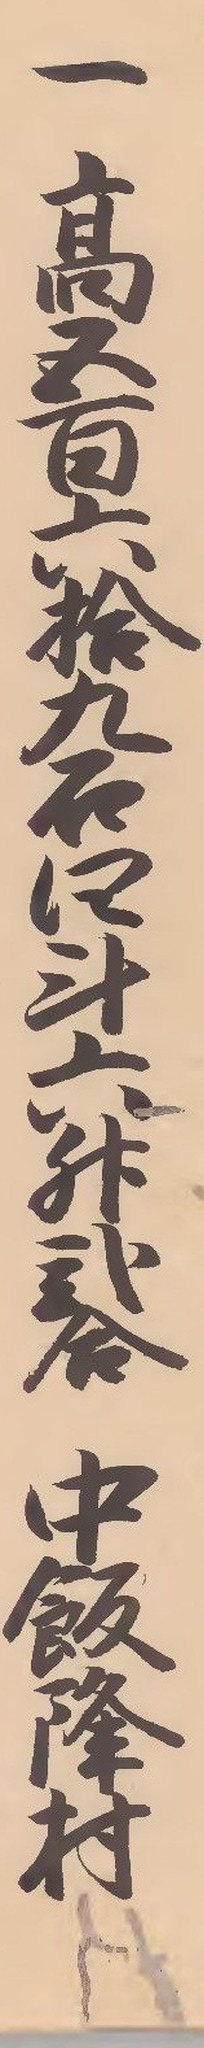一高五百六拾九石四斗六升弐合中飯降村
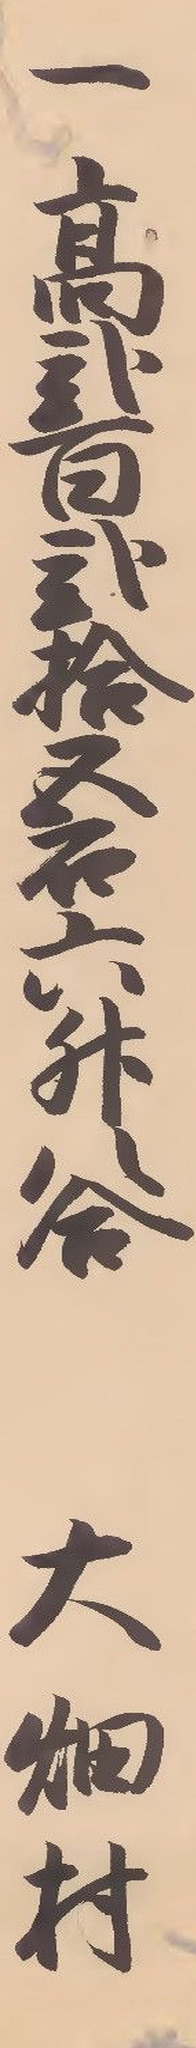一高弐百弐拾五石六升八合大畑村
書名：紀伊国郷帳
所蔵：国立公文書館 National Archives of Japan
